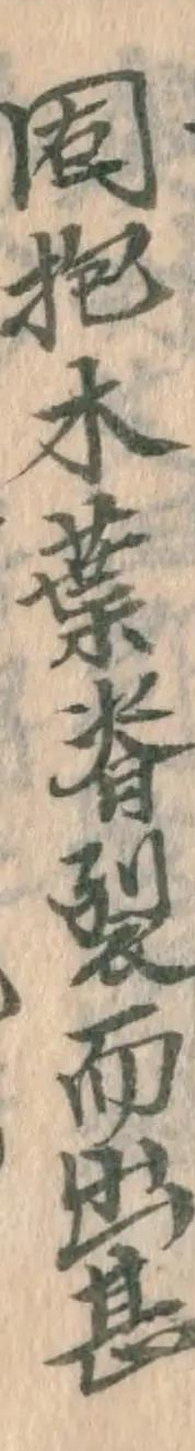固抱木葉脊裂而出甚
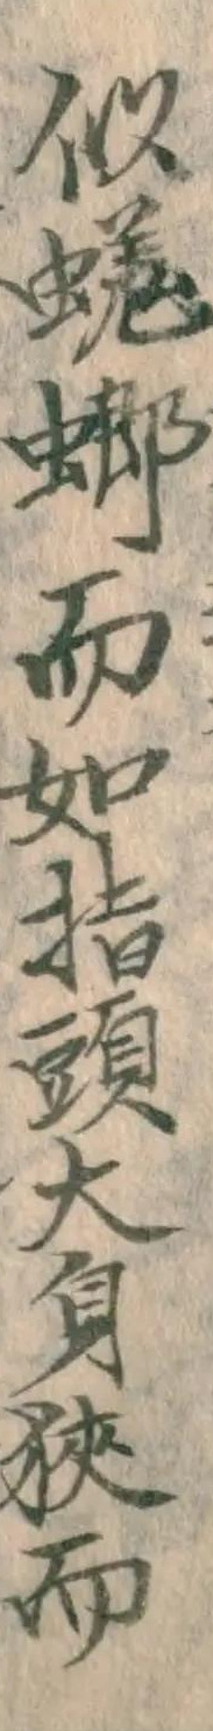似蜣螂而如指頭大身狭而
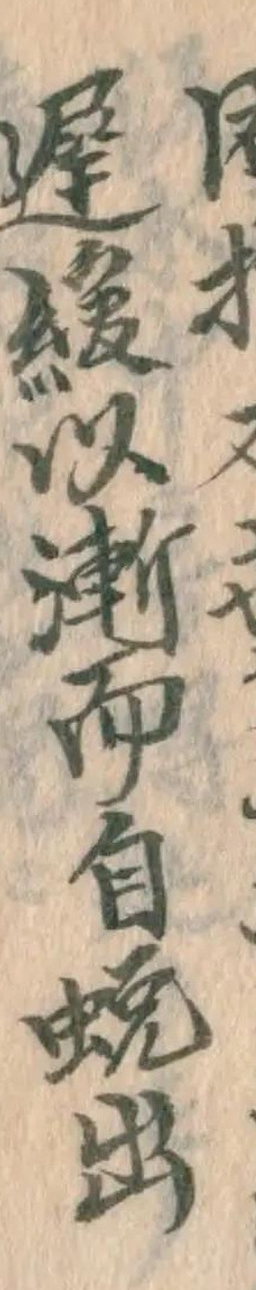遅緩以漸而自蛻出
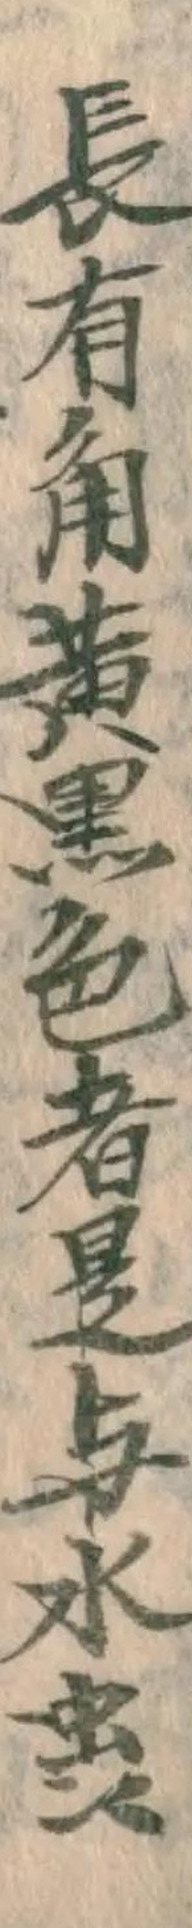長有角黄黒色者是与水虫
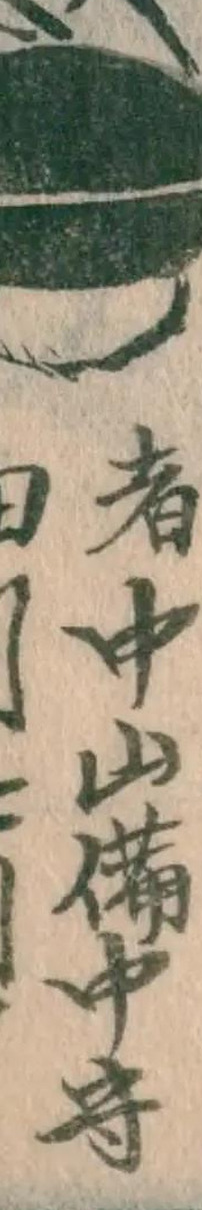左辺者中山備中守
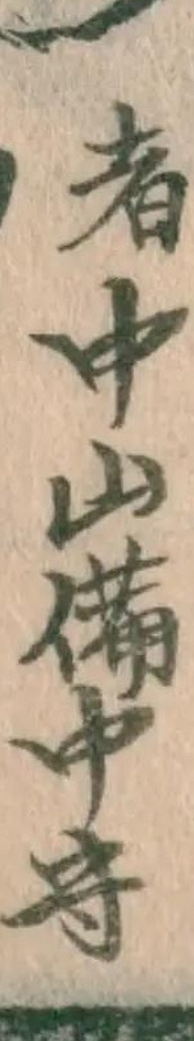左辺者中山備中守
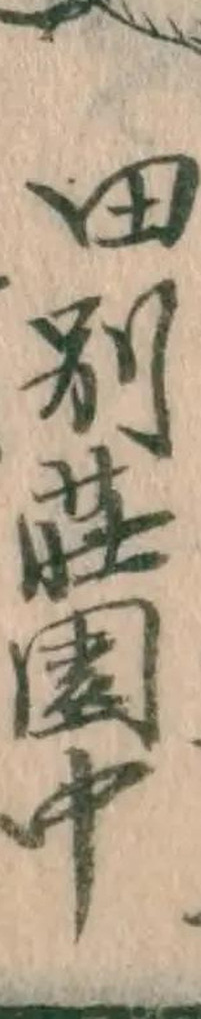高田別荘園中
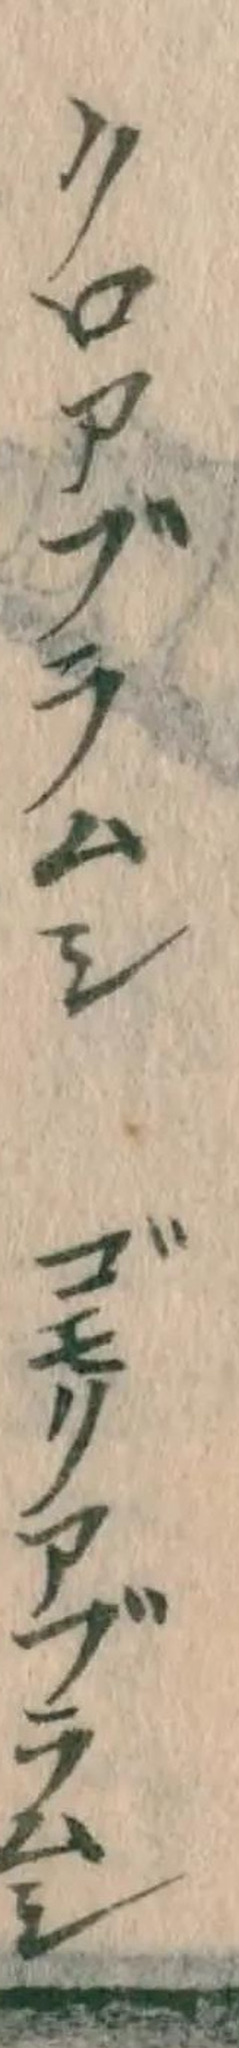クロアブラムシゴモクアブラムシ
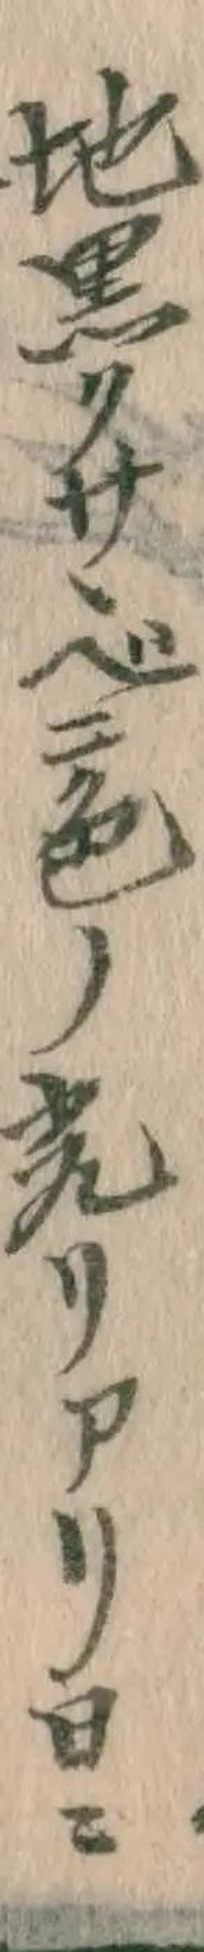地黒クサヽベニ色ノ光リアリ日ニ
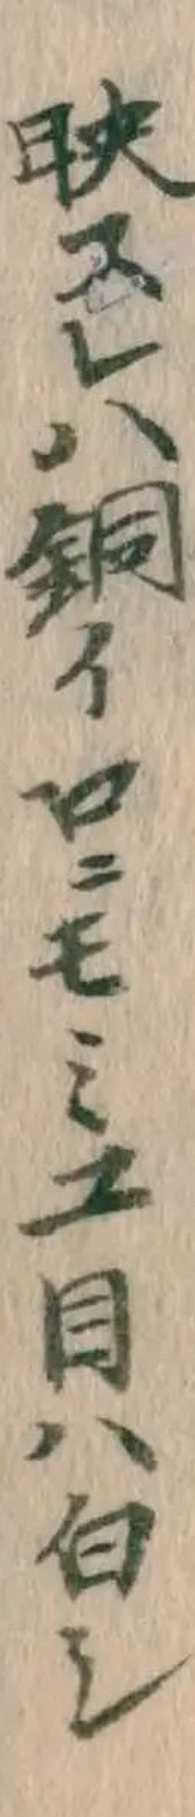映スレハ銅イロニモミユ目ハ白シ

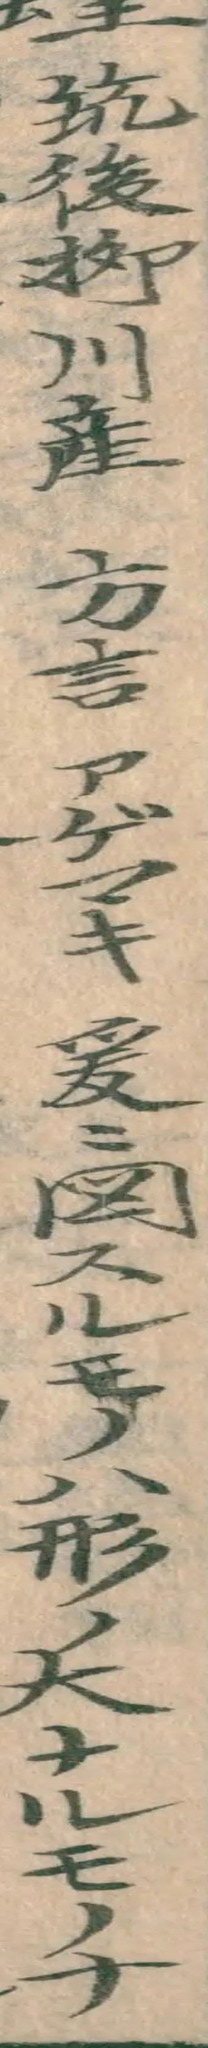蟶筑後柳川産方言アゲマキ爰ニ図スルモノハ形ノ大ナルモノナ
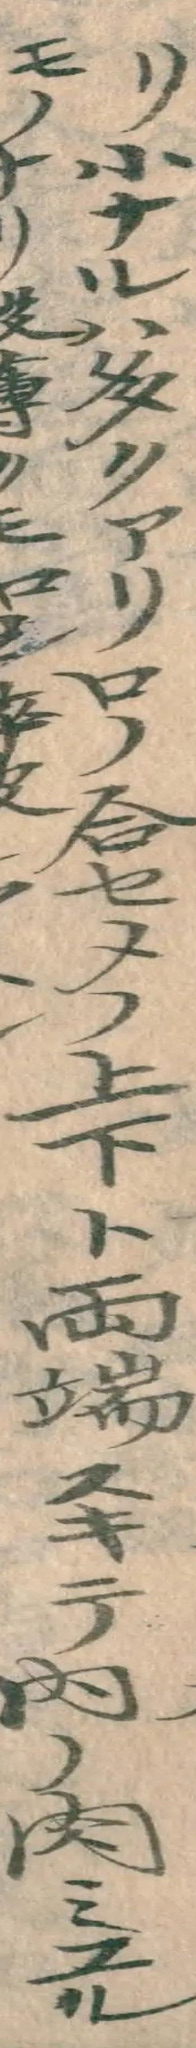リ小ナルハ多クアリ口ノ合セメノ上下ト両端スキテ内ノ肉ミユル
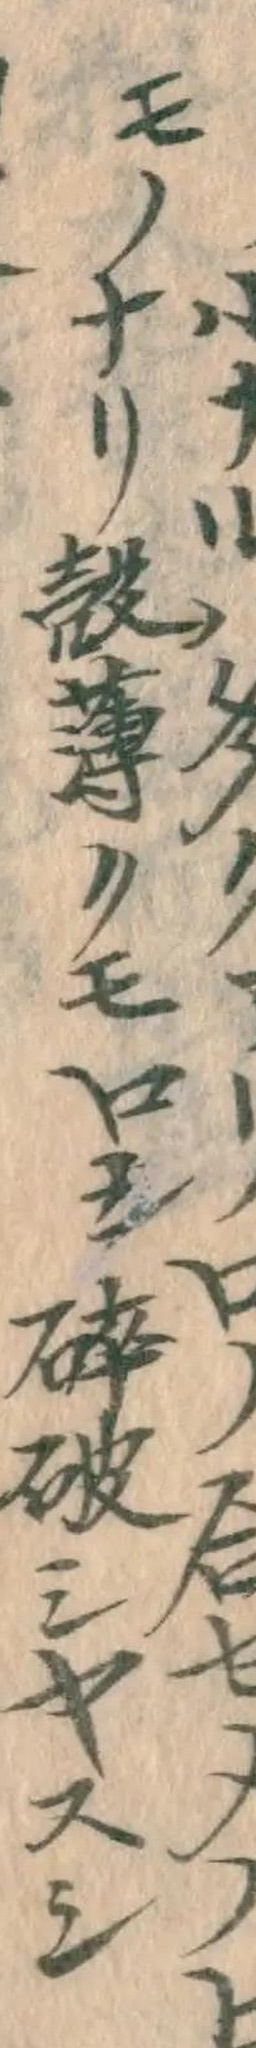モノナリ殻薄クモロシ碎破シヤスシ
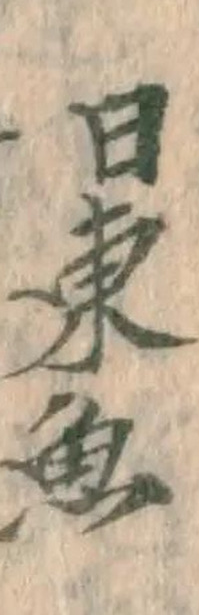日東魚
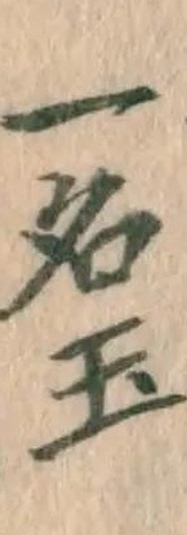一名玉
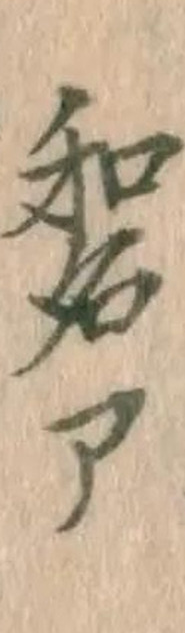和名ア
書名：千蟲譜 3巻. [3]
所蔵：国立国会図書館 National Diet Library, JAPAN
